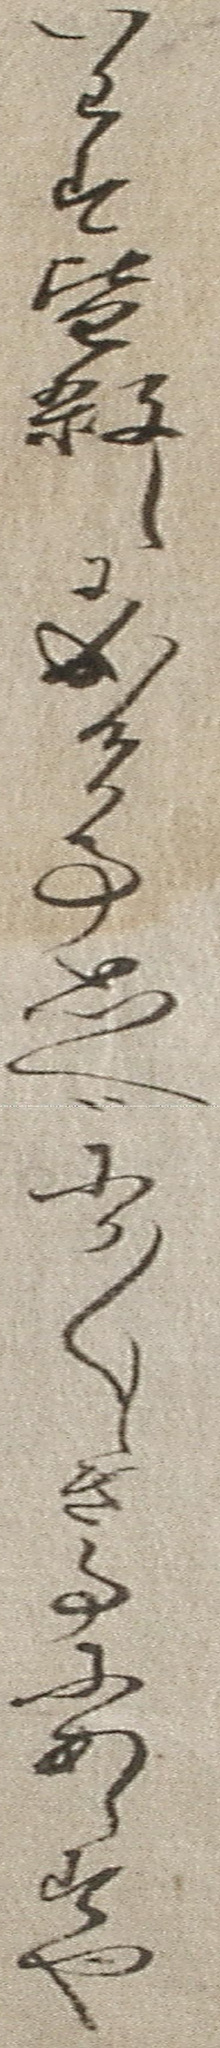いわす皆殺しに成たる事思へはにか〳〵しき事にあらすや
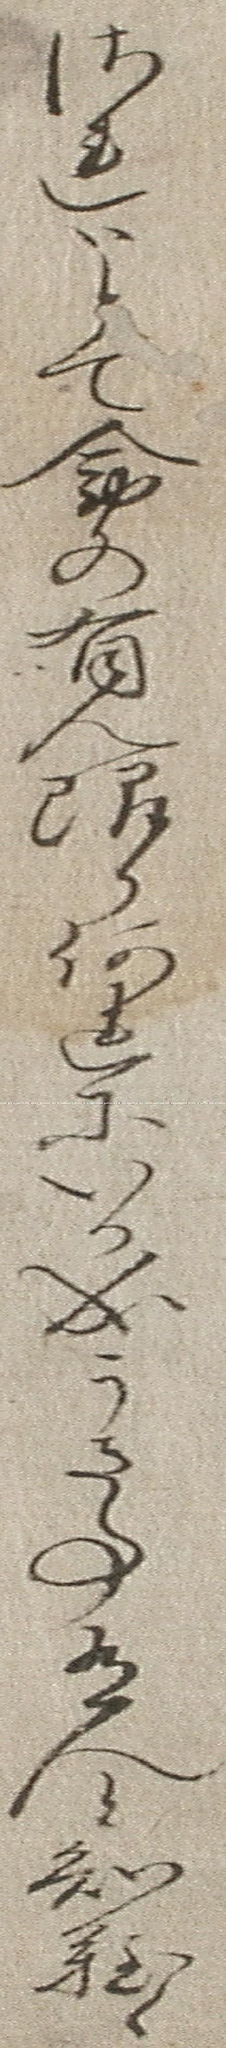されはとて命の有ん限り何れにいか成うき事有んと知程に
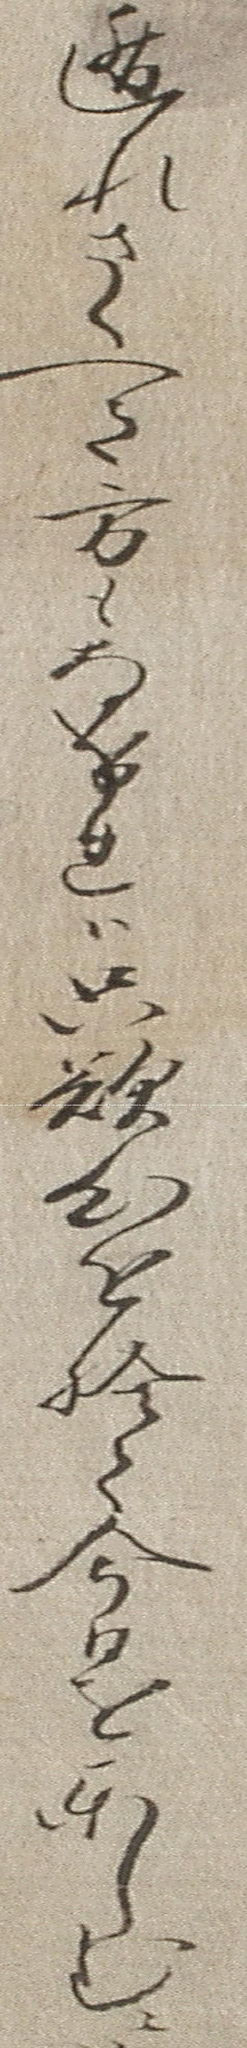遁れさくへき方もなけれは只欲心を捨て今日を楽しむには
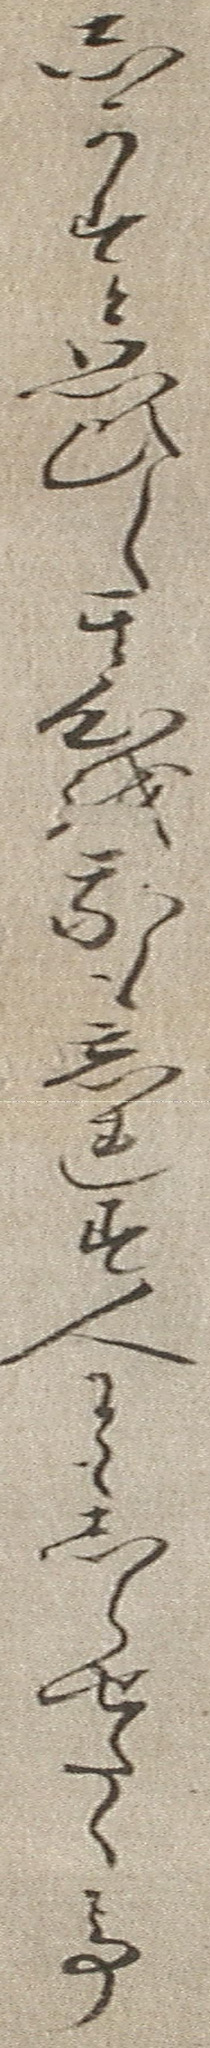しかすと思ひし其心を我も忘れす人にもしらせたく事
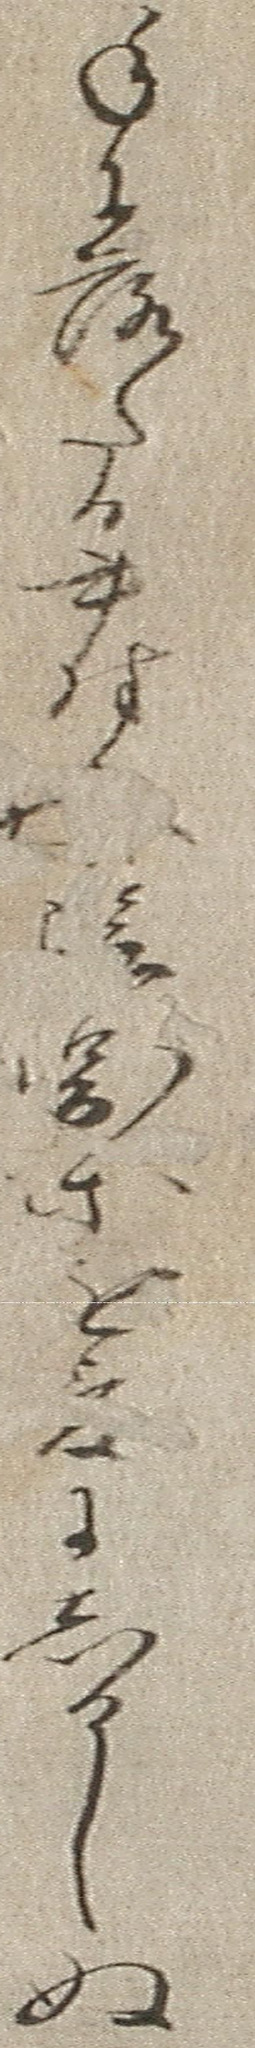手に落たる書付け絵図等を爰にしるしぬ
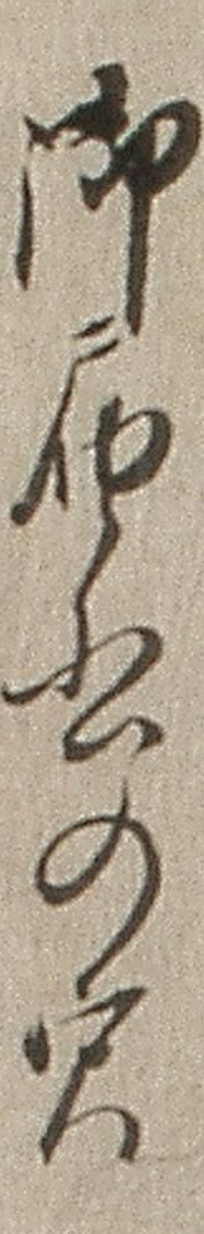御届書の写
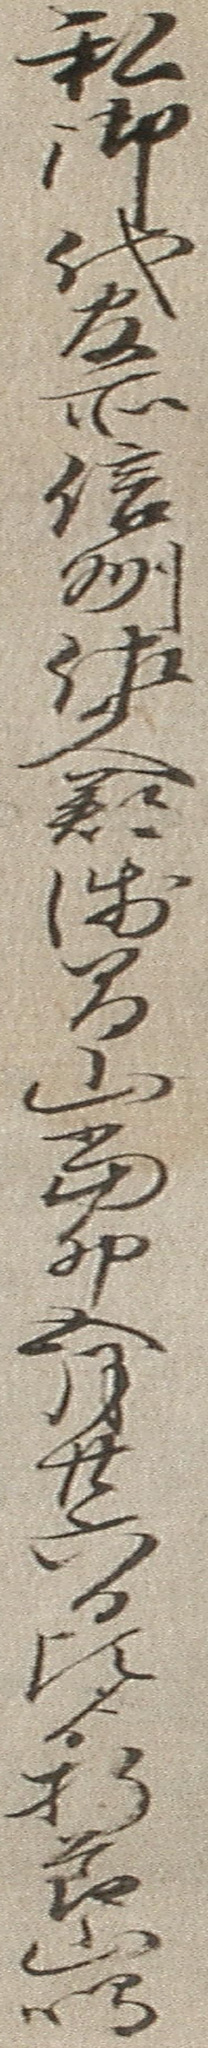私御代官所信州佐久郡浅間山当卯五月廿六日頃ゟ折節山鳴
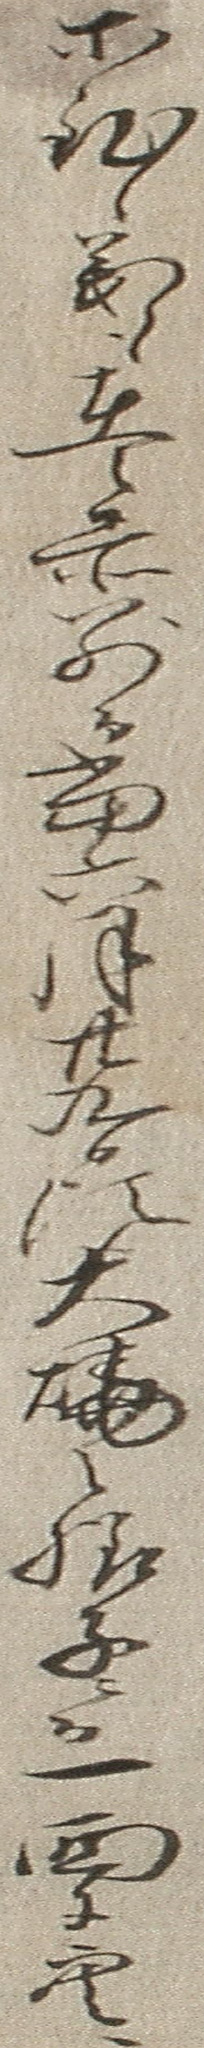等致候義も在候所別而当六月廿九日頃大焼之様子に而一面に空に
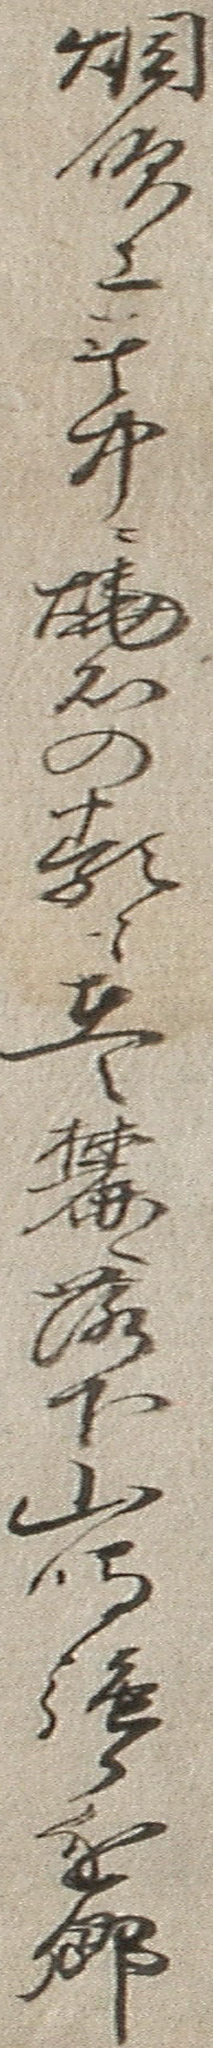烟吹上其中に焼石の類も在之麓へ落下山鳴強く近郷
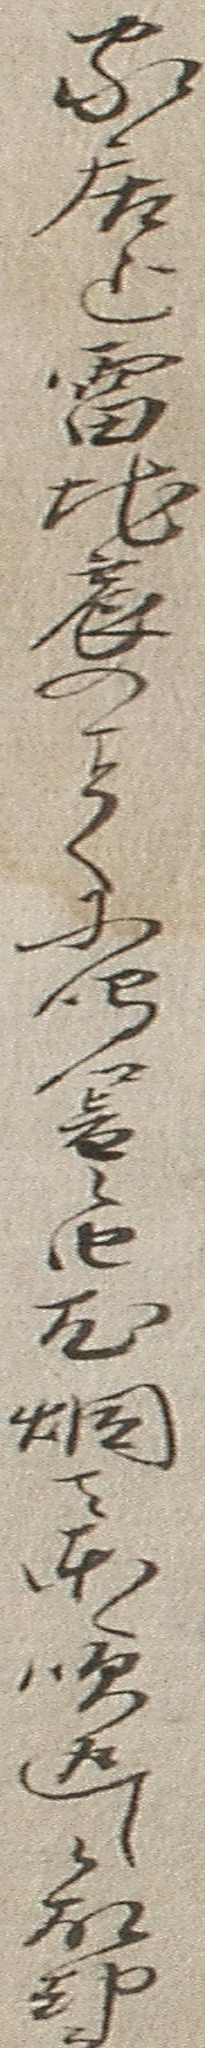家居迄雷地震のことくに鳴響之由尤烟は東へ吹返し候故却而
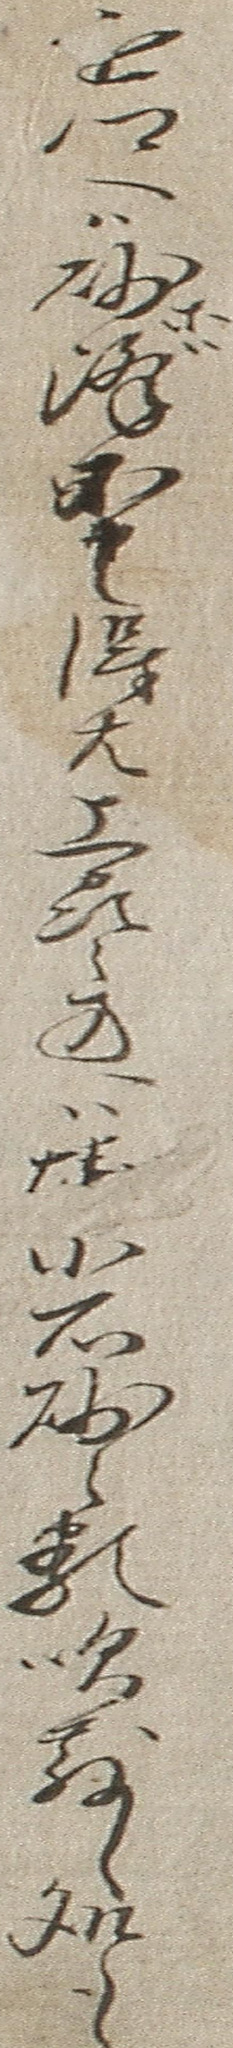近郷へは砂等は降り不申候得共上州之方へは焼小石砂之類吹散候処も
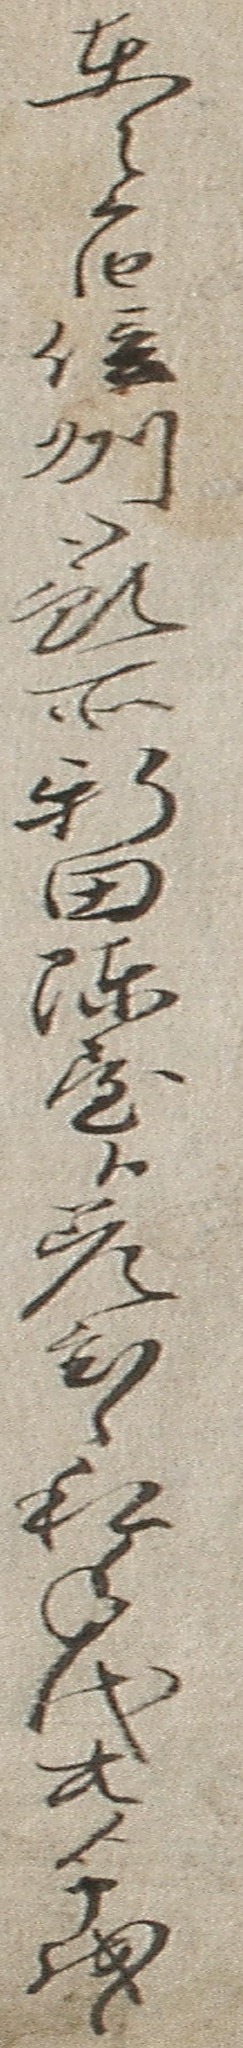在之候由信州御領所新田陣屋ゟ差置候私手代共ゟ申越候
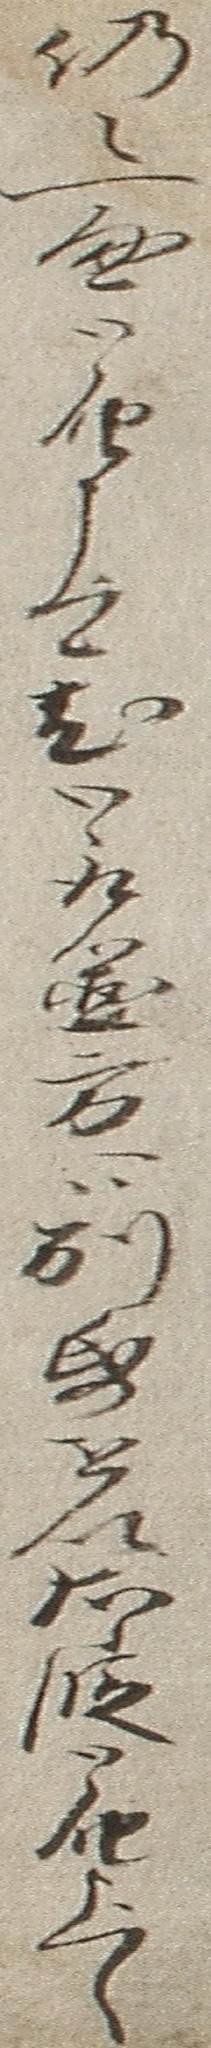仍之一通御届申上候尤御取箇方へは別紙を以右之段御届申上候
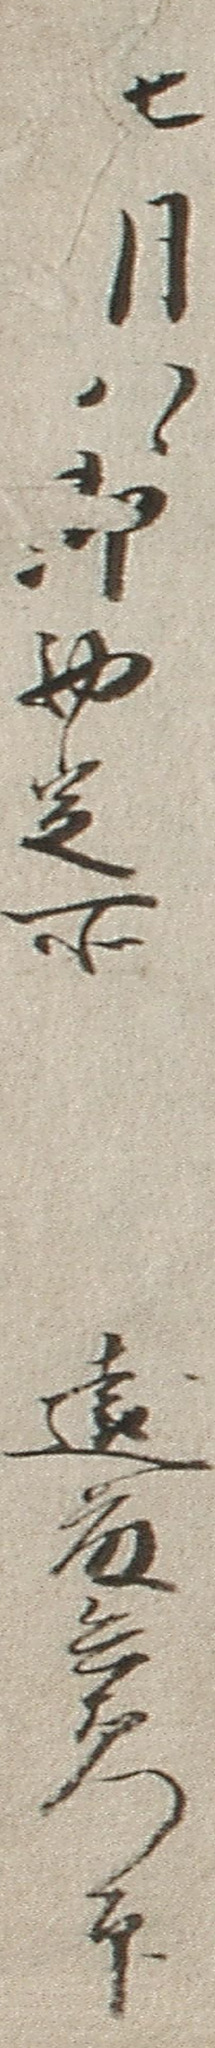七月八日御勘定所遠藤兵右衛門印

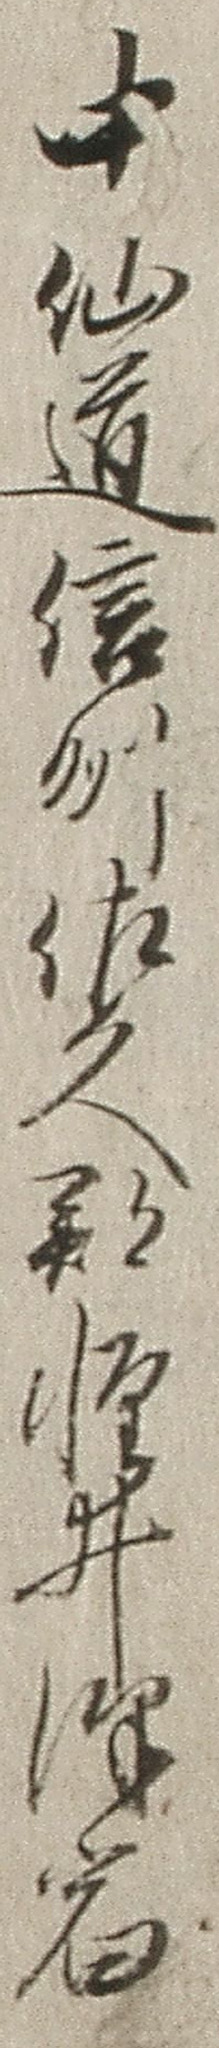中仙道信州佐久郡軽井沢宿
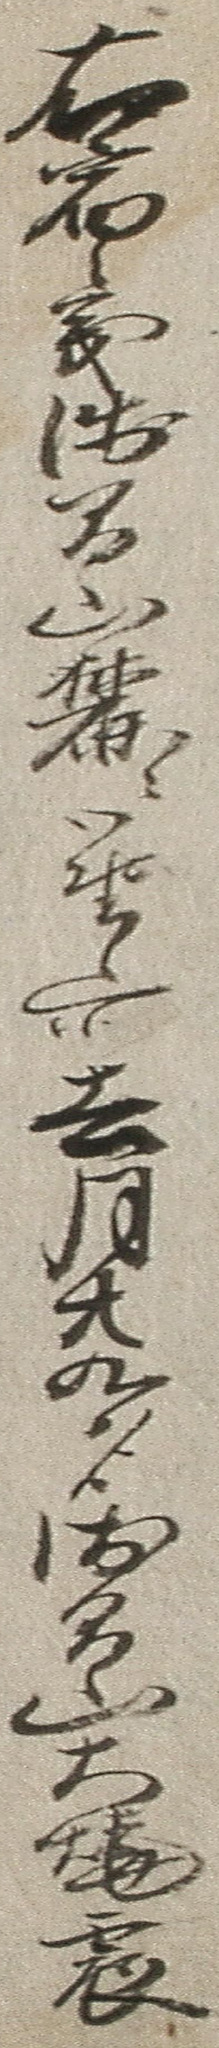右宿之義浅間山山麓に御座候所去月廿九日ゟ浅間山大焼震
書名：太平秘録抜書　浅間山燒及普賢山崩
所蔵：東京大学地震研究所図書室 Earthquake Research Institute Library, The University of Tokyo, JAPAN
